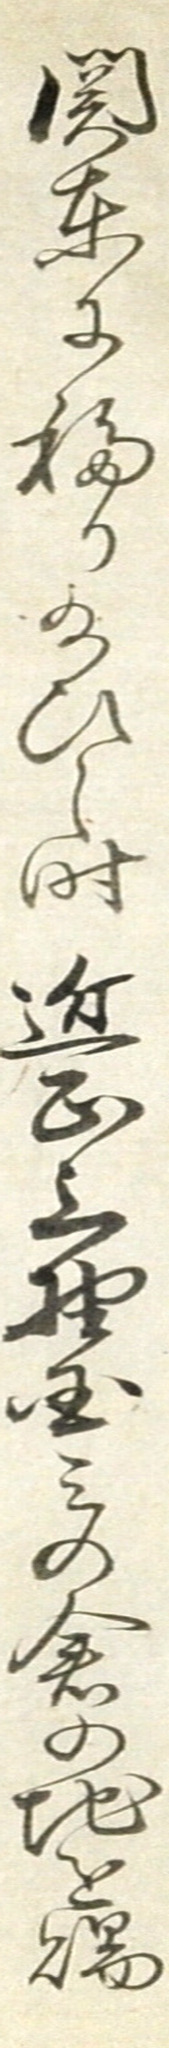関東に移り給ひし時近正上野国三の倉の地を賜
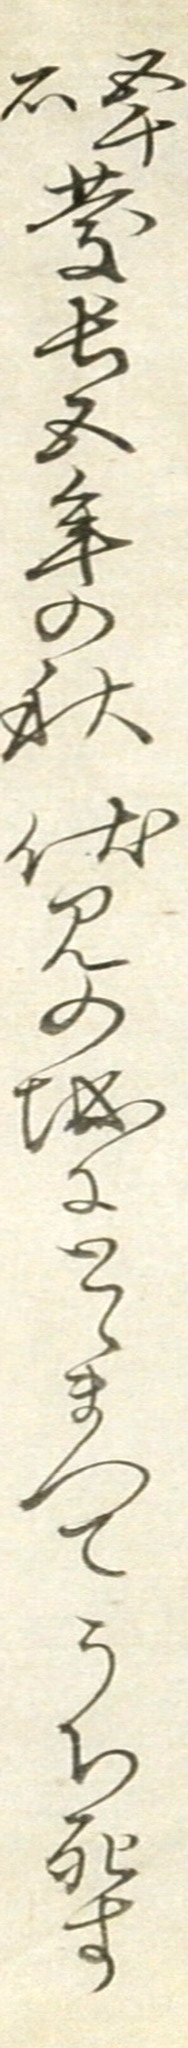五千石慶長五年の秋伏見の城にとゝまつてうち死す
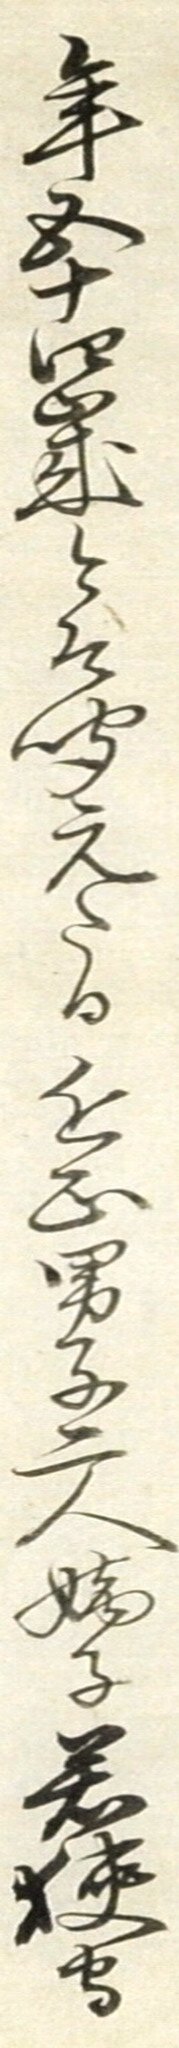年五十四歳とそ聞えたる近正男子二人嫡子若狭守
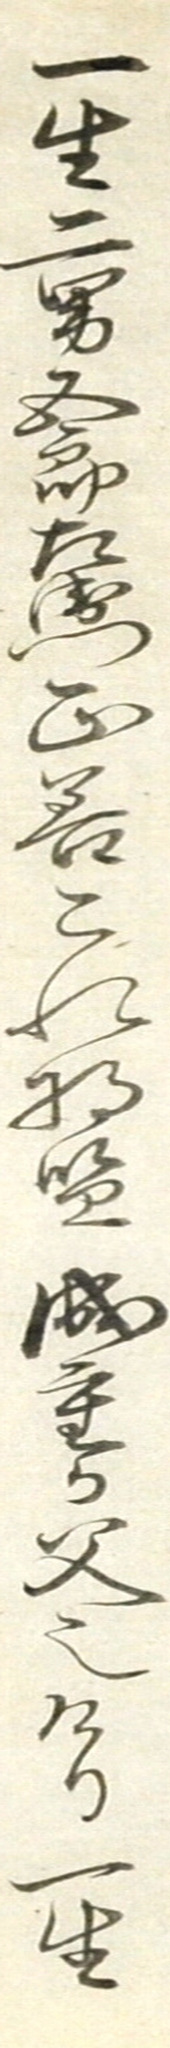一生二男五郎左衛門正善これ将監成重か父也けり一生
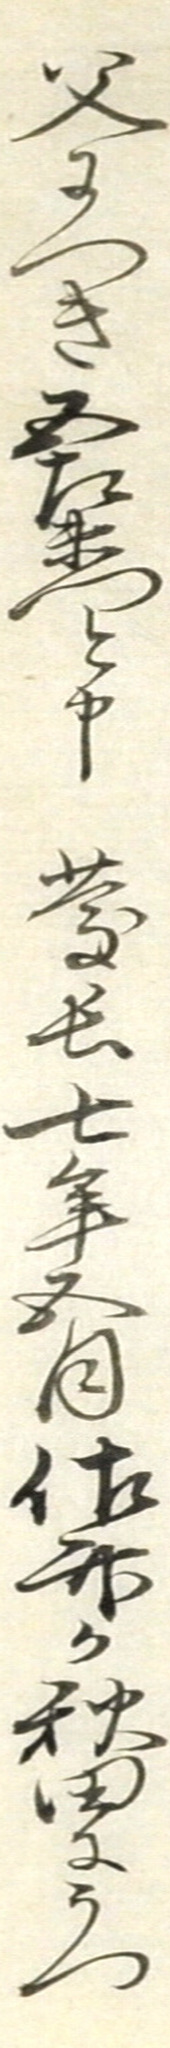父につき五左衛門と申慶長七年五月佐竹か秋田にうつ
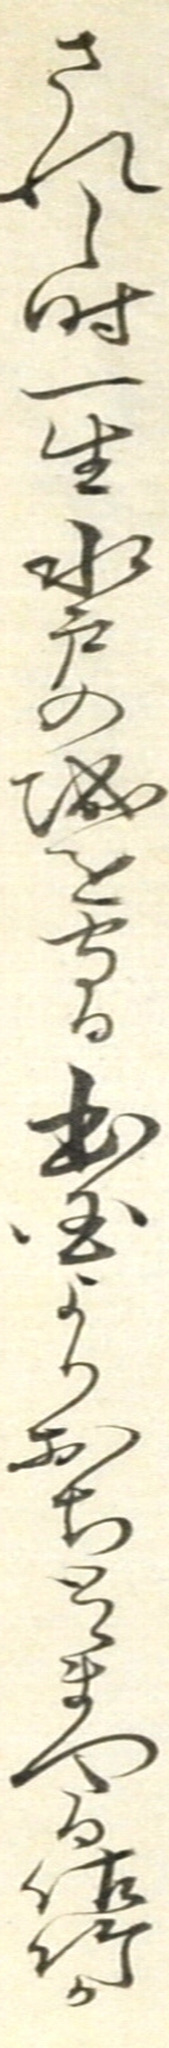されし時一生水戸の城を守る出国よりおちとゝまつたる佐竹か
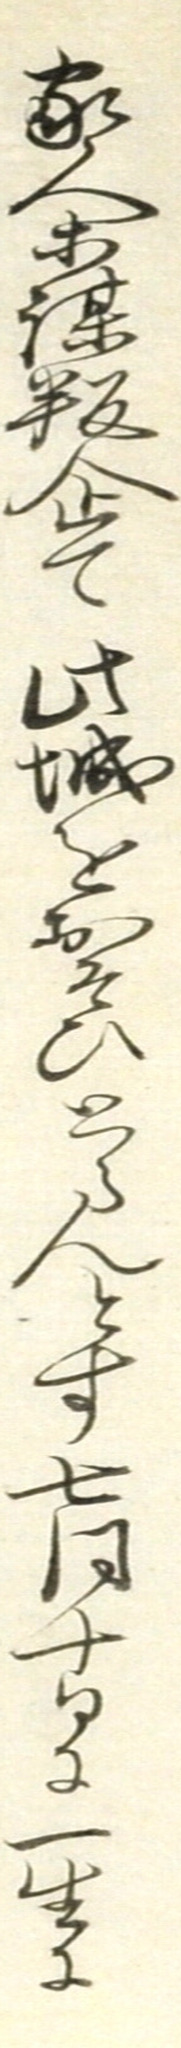家人等謀叛企て此城をおそひとらんとす七月十日に一生に
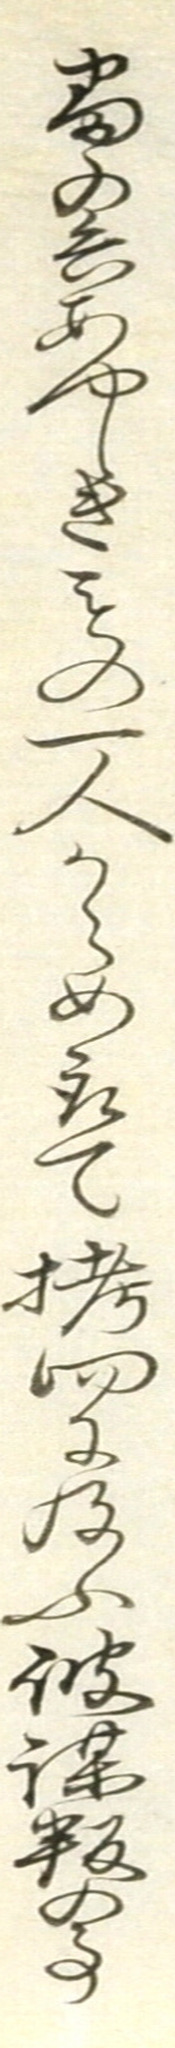番の兵あやしきもの一人からめ取て拷問に及ふ彼謀叛の事
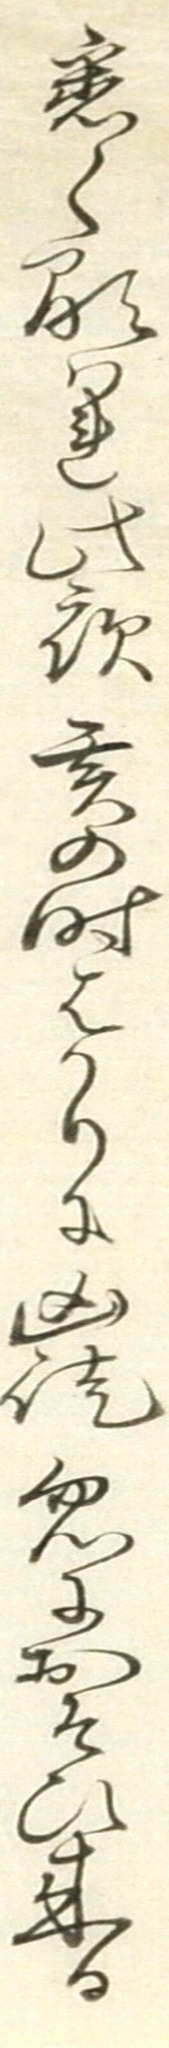悉く顕はれ此夜亥の時はかりに凶徒忽におそひ来る
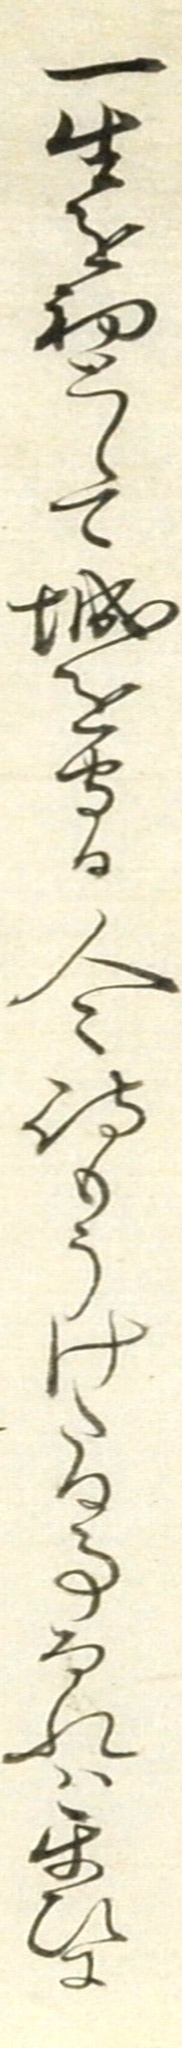一生を初として城を守る人々待もうけたる事なれは互ひに
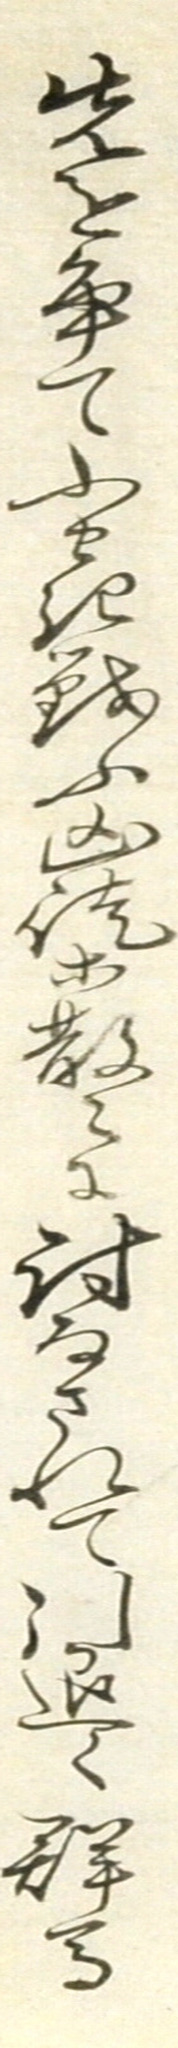先を争てふせき戦ふ凶徒等散々に討なされて引退く群馬
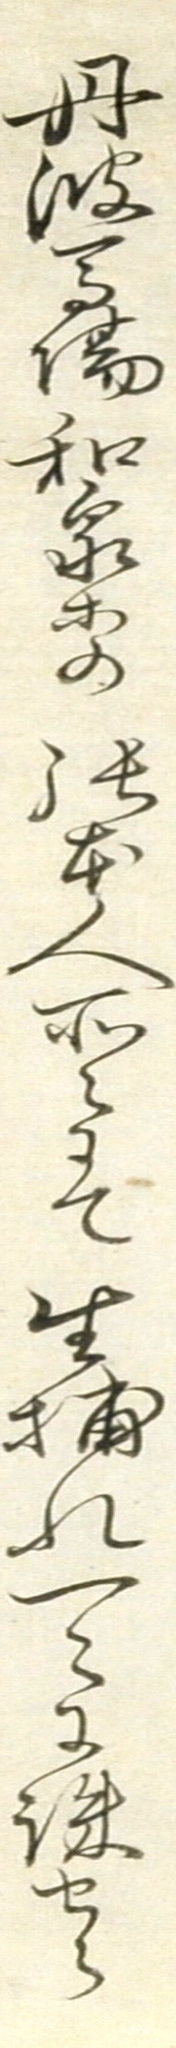丹波馬場和泉等の張本人所々にて生捕れ一々に誅せら
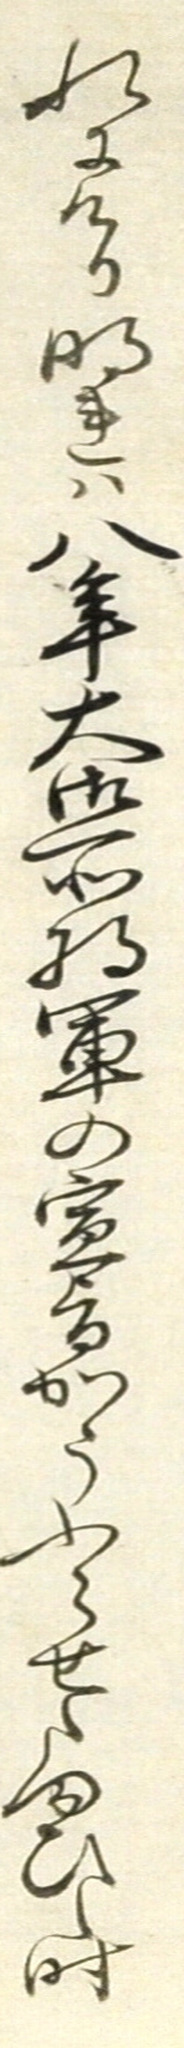れにけり明れは八年大御所将軍の宣旨かうふらせたまひし時
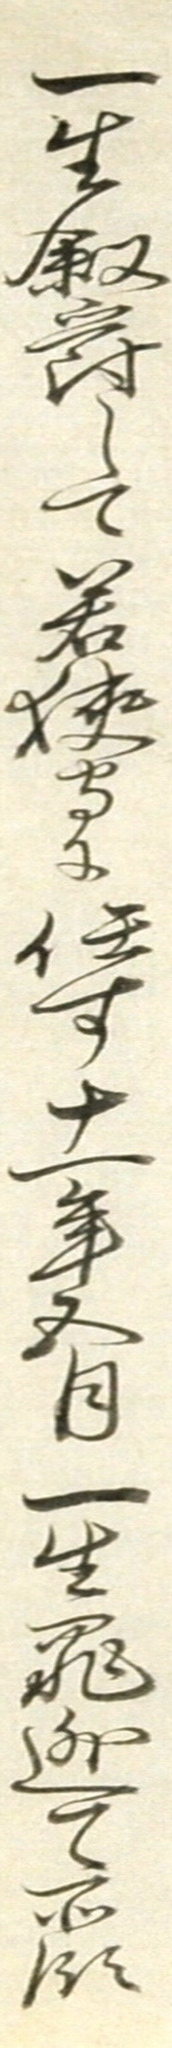一生叙爵して若狭守に任す十一年五月一生飛逃て所領

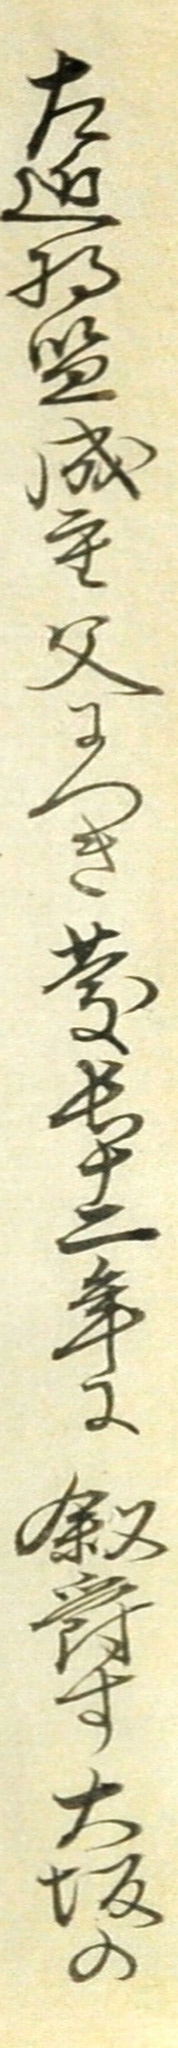左近将監成重父につき慶長十二年に叙爵す大坂の
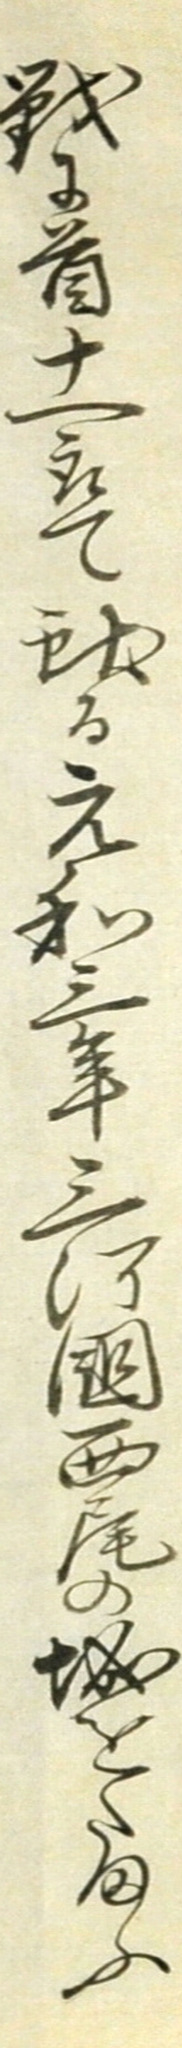戦に首十一取て献る元和三年三河国西尾の城をたまふ
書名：藩翰譜（二・三）
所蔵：伊那市立高遠町図書館・合同会社AMANE
